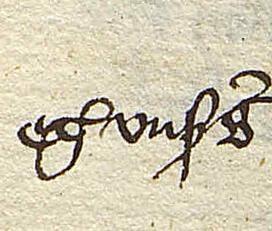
eg* vnſ* B*
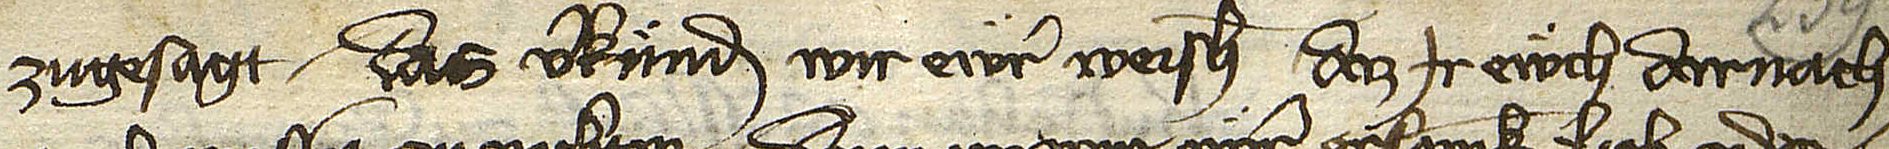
ʒugeſagt / das v*künd* wir ew*r weiſh* / daʒ Ir ewch darnach
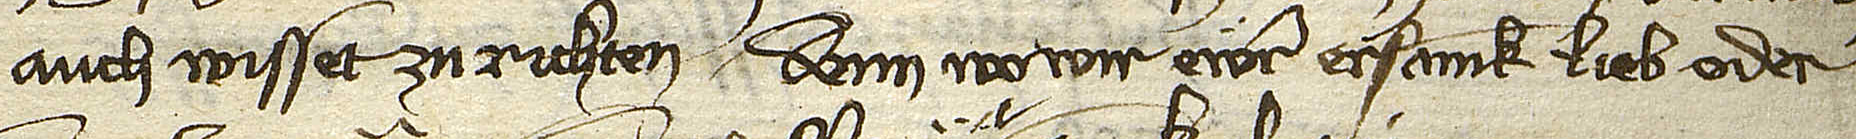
auch wiſſet ʒu richten / Denn wo wir ew*r erſamk* lieb oder
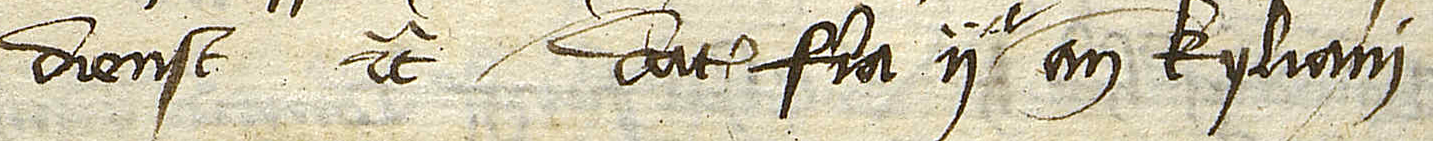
dienſt ec* / Dat* fia* ii* an* kyliani
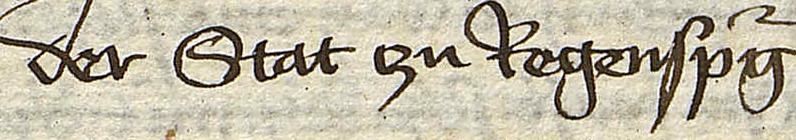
Der Stat cʒu Regenſp*g
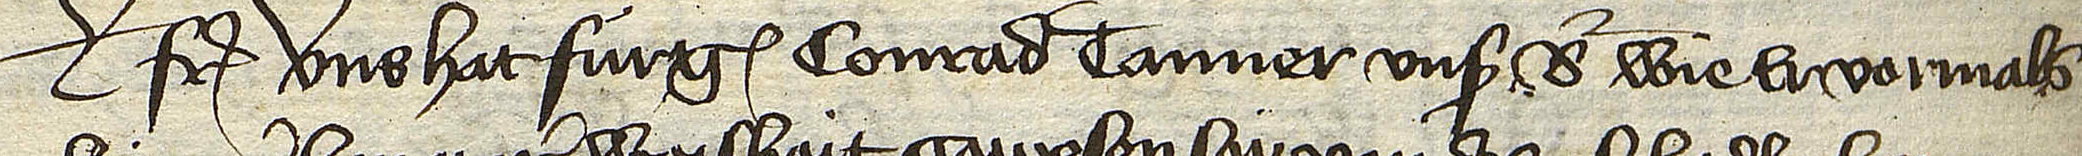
L* fr* Vns hat fürg* Conrad Tanner vnſ* B* wie Er vormals
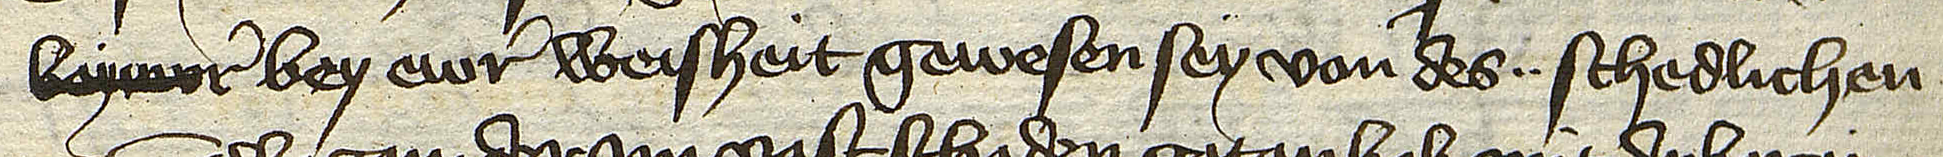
bey ew*r bey ew*r weiſheit geweſen ſey von des ~ ſchedlichen
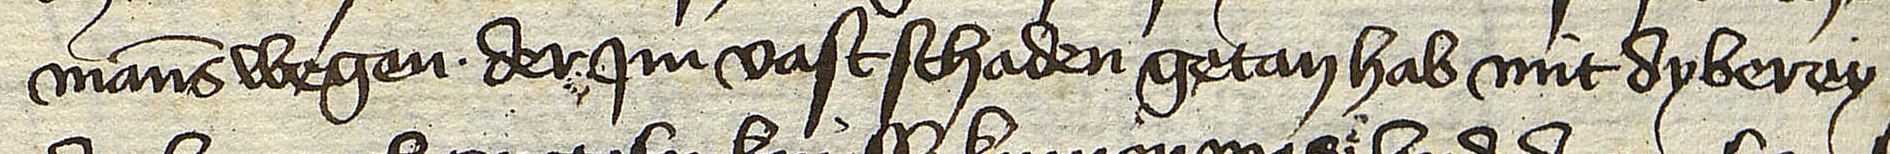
mans* wegen . der Im vaſt ſchaden getan hab mit dyberey
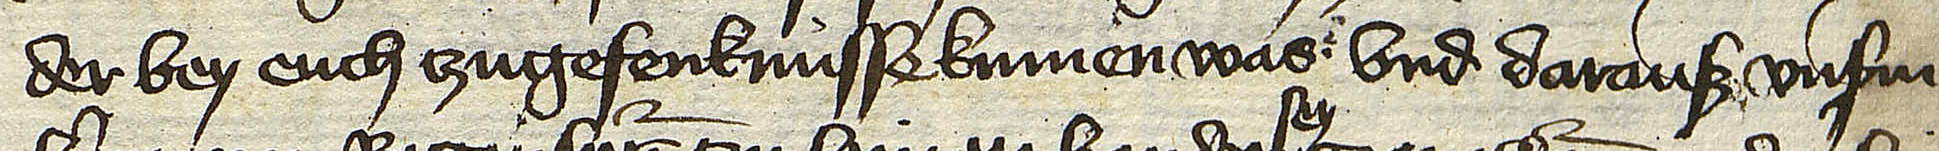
der bey euch cʒugefenknüſſe kumen was . vnd darauſʒ vnſ*m
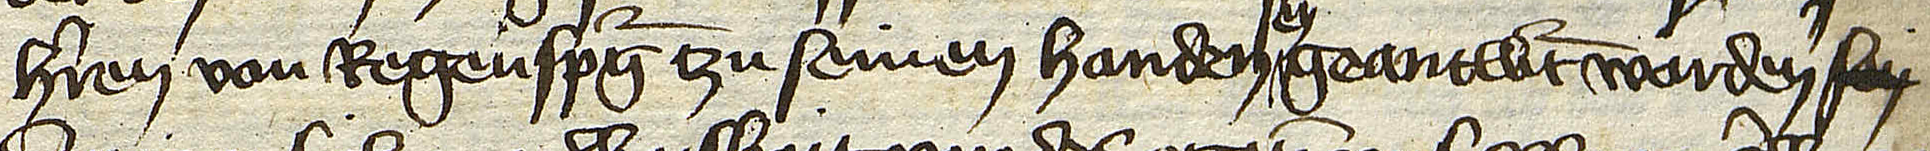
h*ren von Regenſp*g cʒu ſeinen handen geantw*t wurden ſey
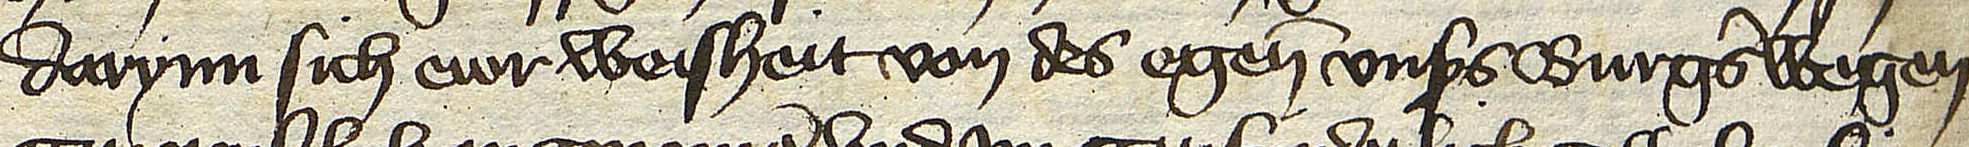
darynn ſich ewr weiſheit von des egen* vnſ*s Burg*s wegen
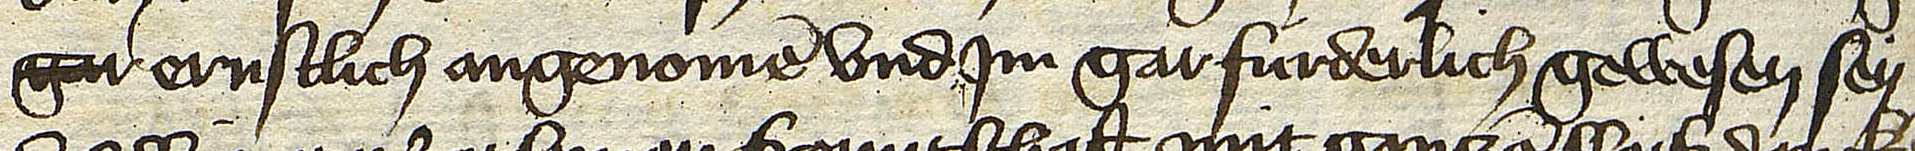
gar ernſtlich angenome* vnd Im gar fürderlich geweſen ſey
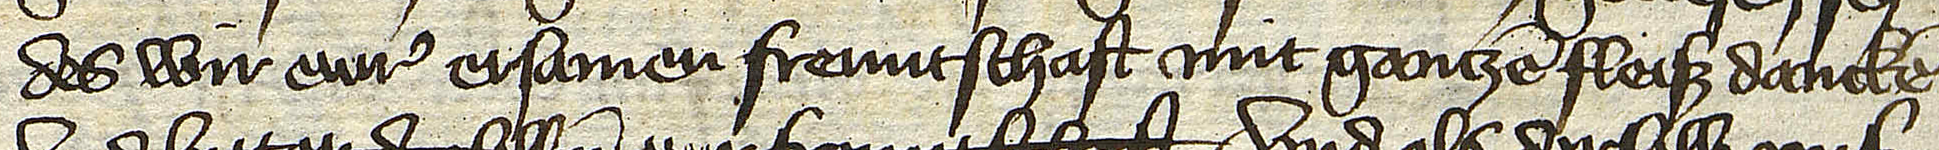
des wir ew*r erſamen freuntſchaft mit gancʒe* fleiſʒ dancke*
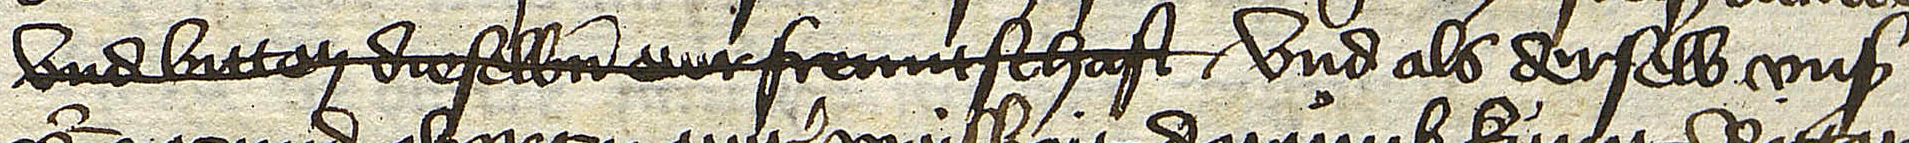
vnd bitten dieſelb*n ewr freuntſchaft / Vnd als derſelb vnſ*
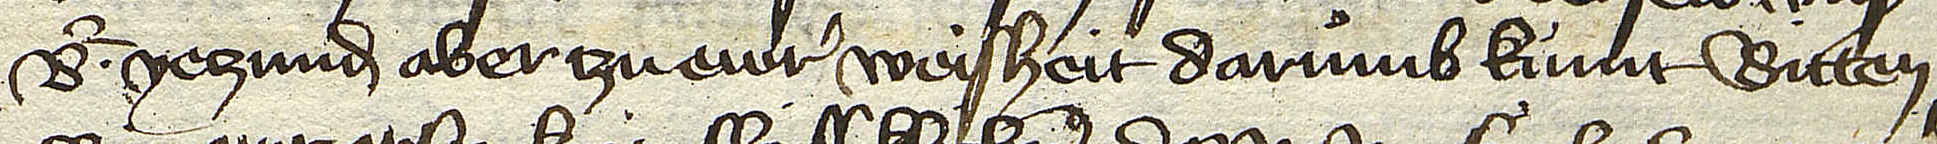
B* . yecʒund* aber cʒu ew*r weiſheit darümb kümt Bitten
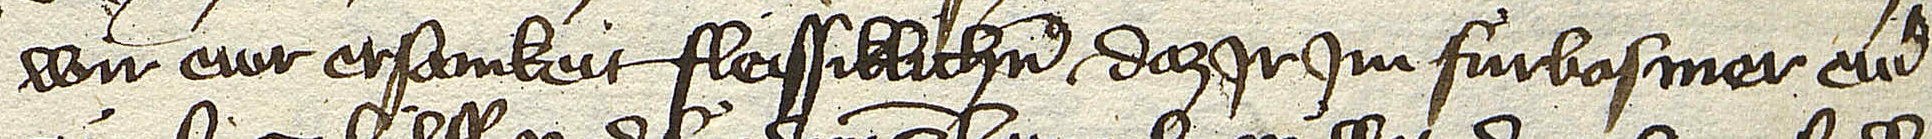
wir ewr erſamkeit fleiſſiklich*n / daʒ Ir Im fürbaſmer ew*
